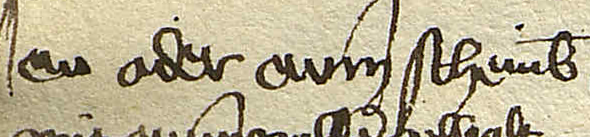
ew oder ewm* ſcheinb*
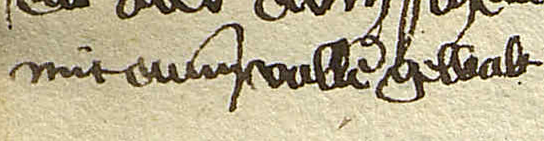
mit ewm* volle* gewalt
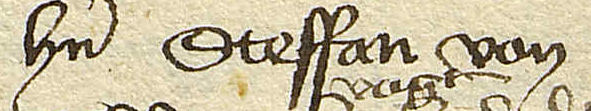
hn* Steffan von
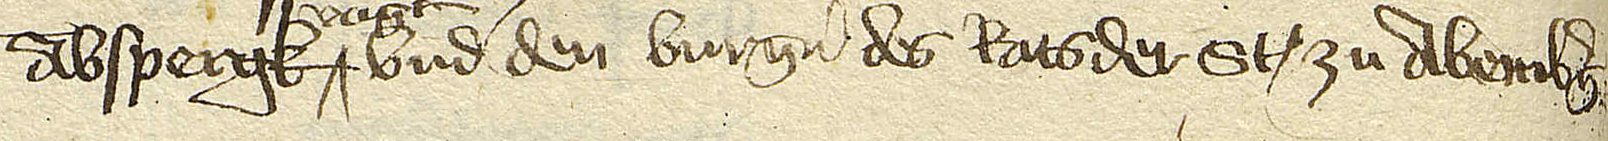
Abſpergk* vnd den burgn* des Rats der St* cʒu Abemb*g
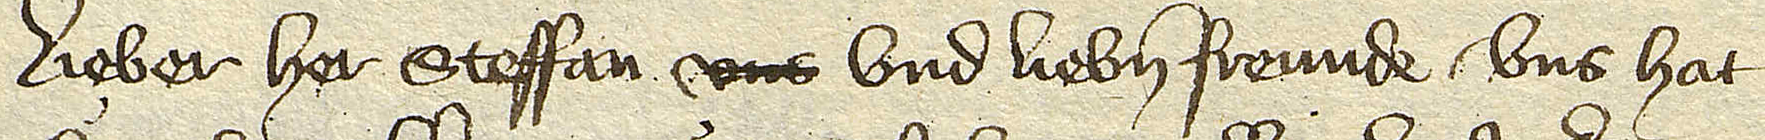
Lieber her Steffan vns vnd liebn* freunde / vns hat
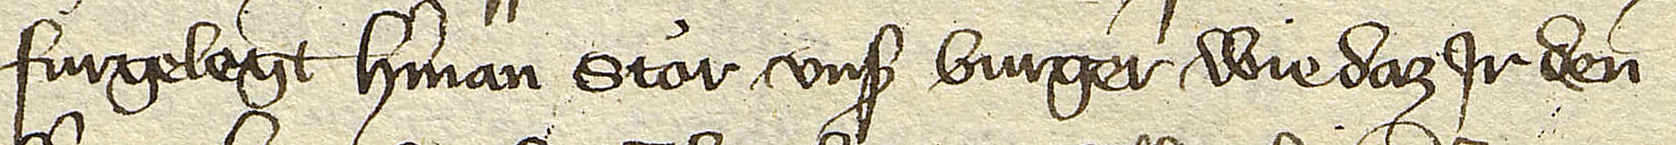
fürgelegt h*man Stör / vnſ* burger / wie daʒ Ir den
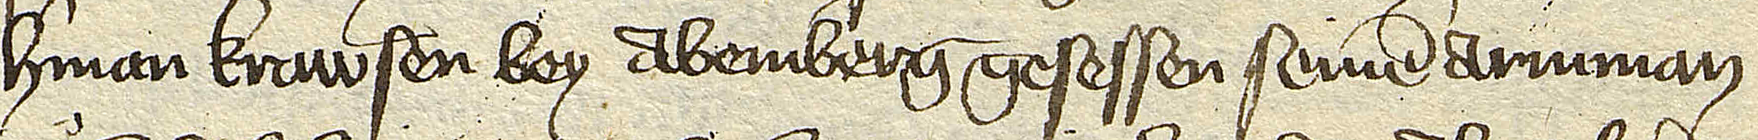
h*man krawſen bey Abemberg geſeſſen ſeine* Armman
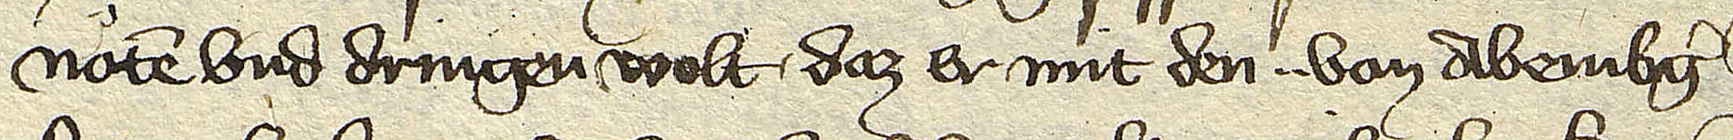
nöte* vnd dringen wolt / daʒ Er mit den ~ von Abemb*g
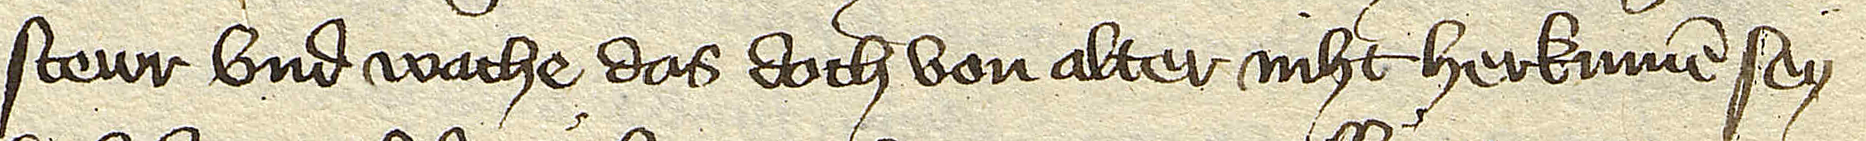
ſtewr vnd wache das doch von alter niht herkume* ſey
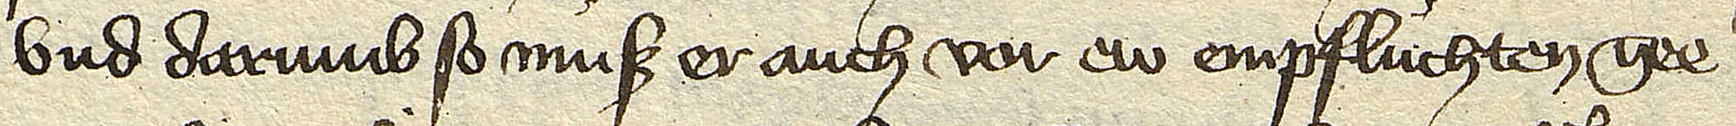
vnd darumb ſo müſʒ er auch vor ew empflüchten gee
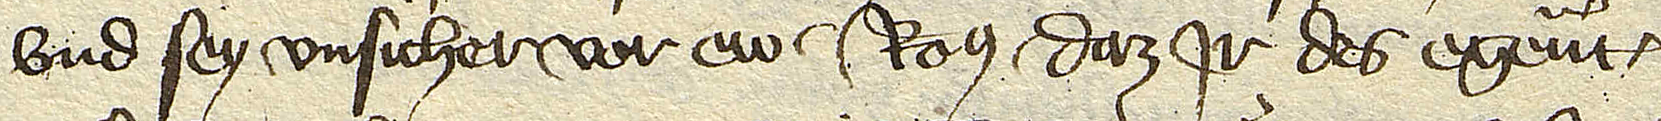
vnd ſey vnſicher vor ew / Ro* / daʒ Ir des egent*
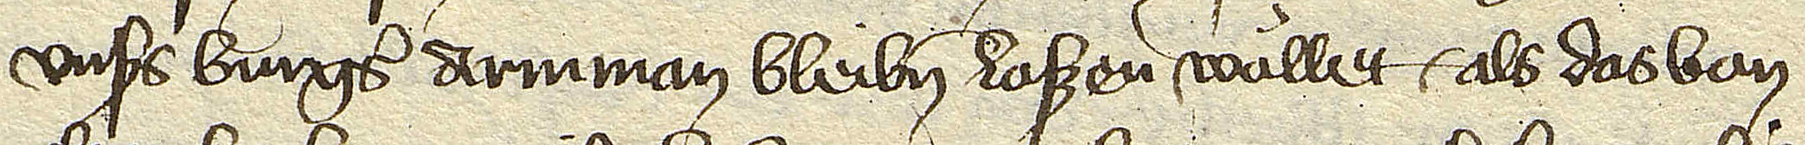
vnſ*s burgs* Armman bleibn* laſʒen wöllet / als das von
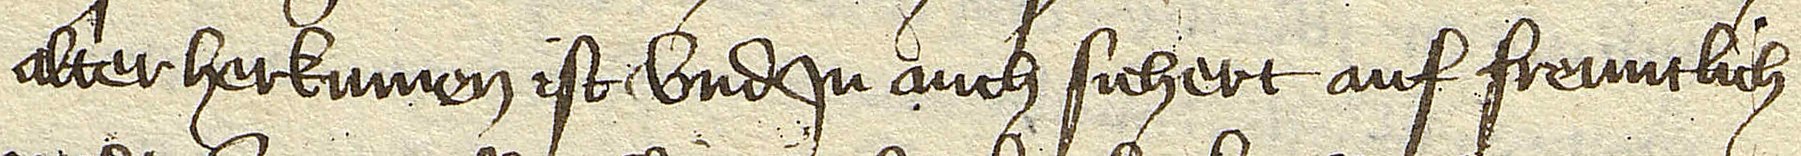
alter herkumen iſt / vnd In auch ſichert auf freuntlich
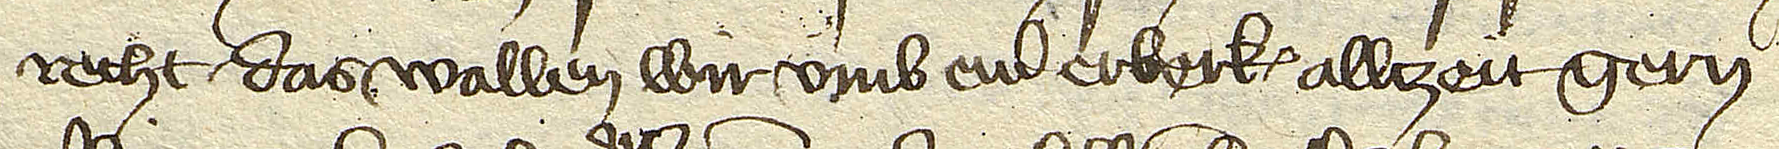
recht / das wollen wir v̈mb ew* erberk* allcʒeit gern
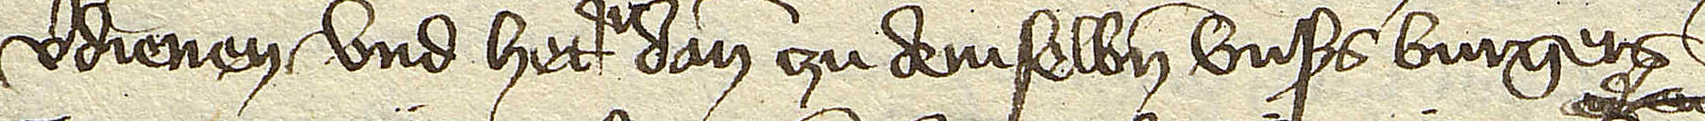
v*dienen /vnd het dan* cʒu demſelbn* vnſ*s burgers
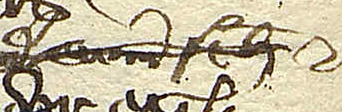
ew* ewm* ſch ec*
